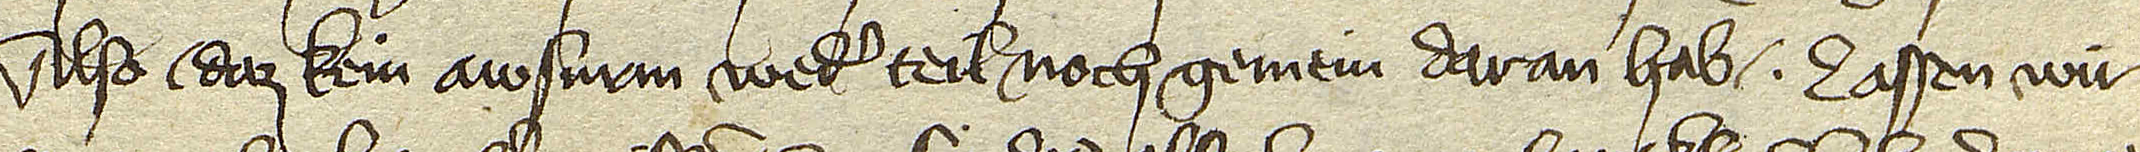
Alſo / daʒ kein awſman wed* teil noch gemein daran hab* / . Laſſen wir
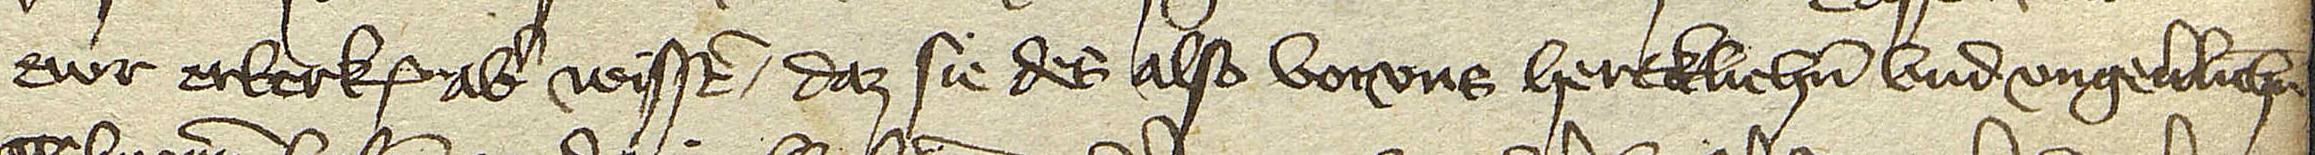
ewr erberk* ab* wiſſe* / daʒ ſie des alſo vor vns hertklichn* vnd vngeu*lichn*
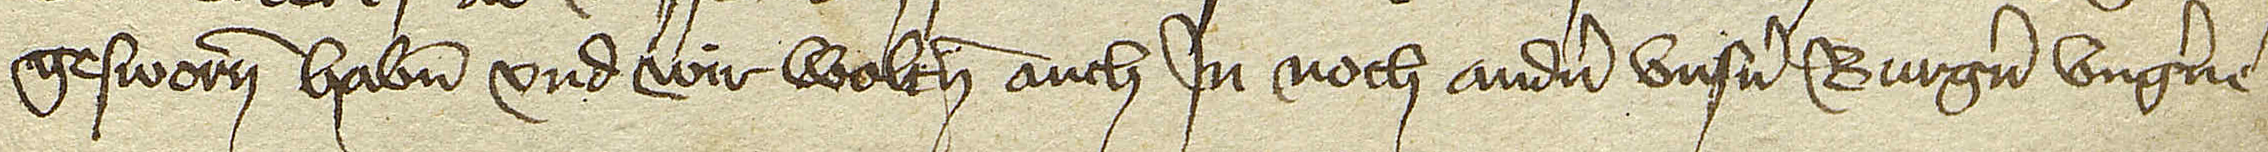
geſworn* habn* vnd wir woltn* auch In noch andn* vnſn* Burgn* vng*ne
